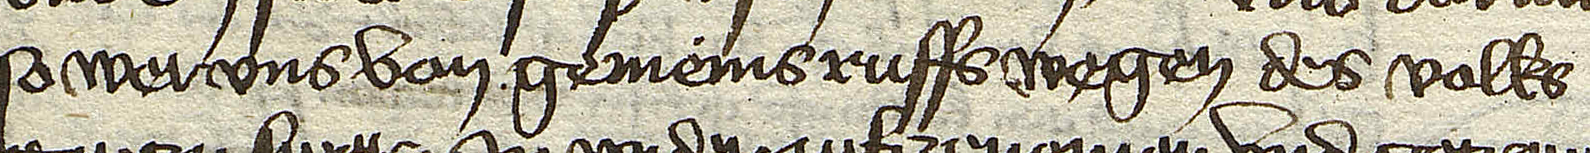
ſo wer vns von . gemeins ruffs wegen des volks
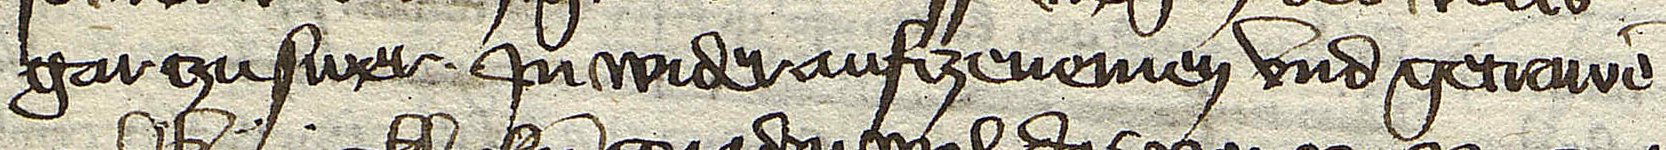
gar cʒu ſwer . In wider aufcʒenemen vnd getrawe*
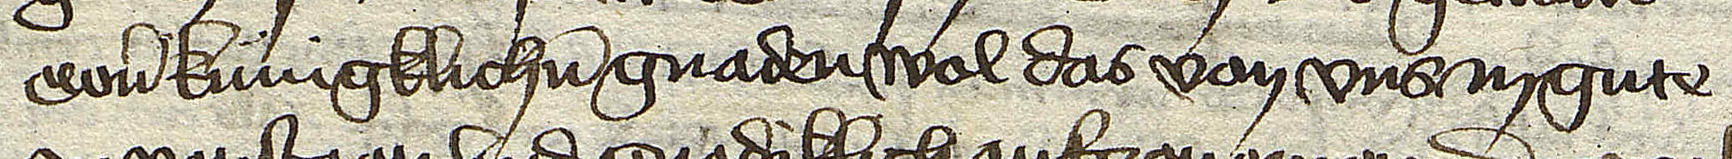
ew*n künigklich*n gnaden wol das von vns in gute
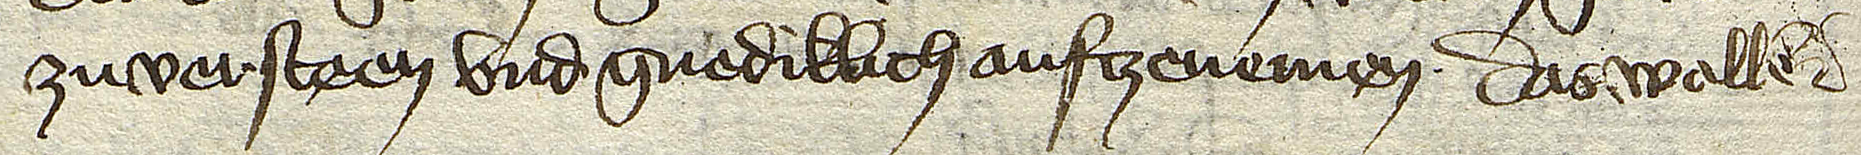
cʒu verſteen vnd gnediklich aufcʒenemen . Das wolle* ec*
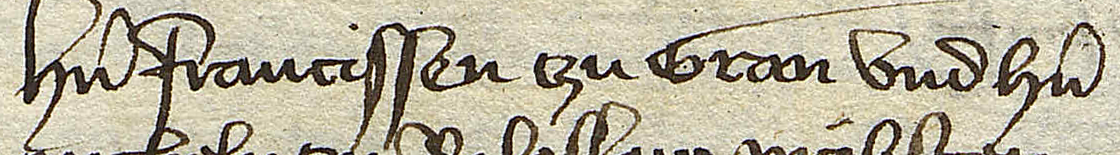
Hn* Franciſſen cʒu Gran vnd hn*
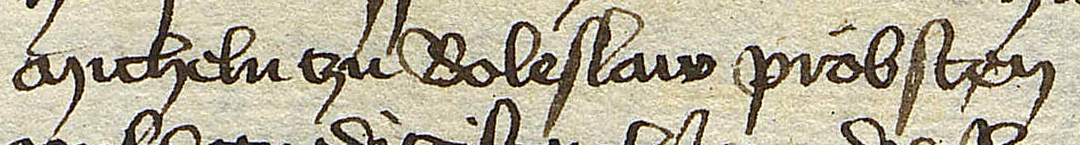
Micheln cʒu Boleſlaw probſten
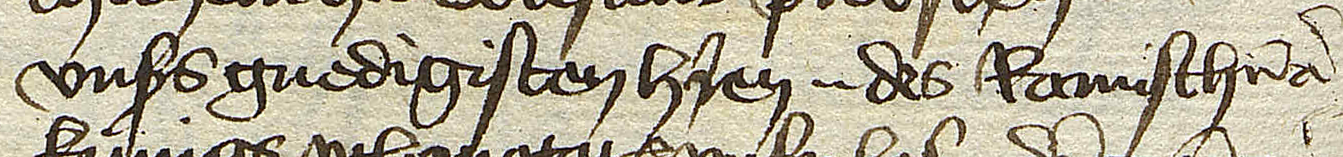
vnſ*s gnedigiſten h*ren ~ des Romiſch*n ec*
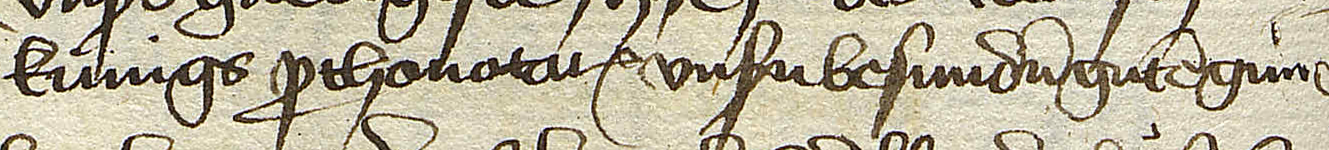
künigs p*thonotar* vnſ*n beſund*n gute* güne*
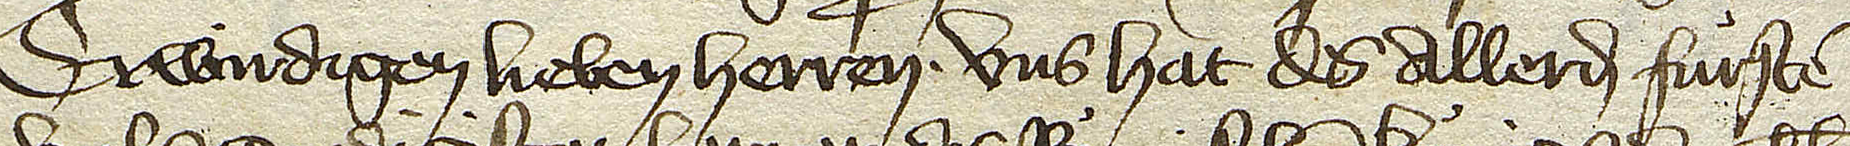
Erwirdigen lieben herren . Vns hat des Allerd* fürſte*
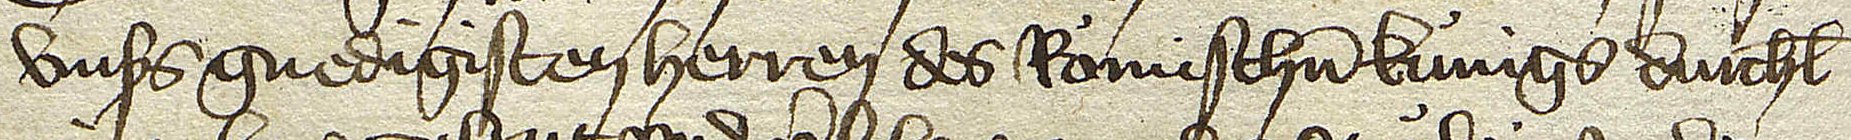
vnſ*s gnedigiſten herren des Römiſch*n künigs durchl*
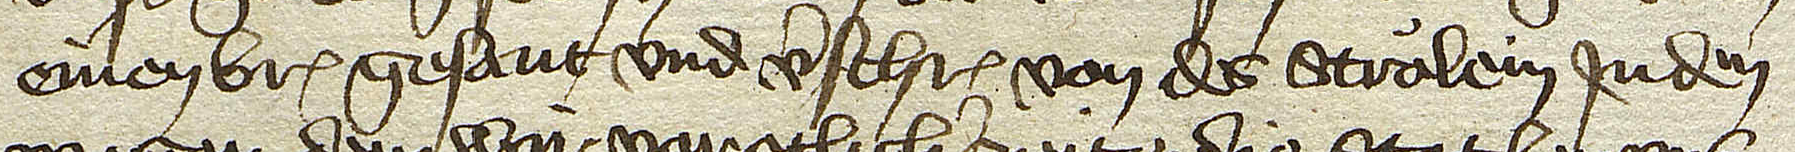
einen br* geſant vnd v*ſchr* von des Strölein Iuden
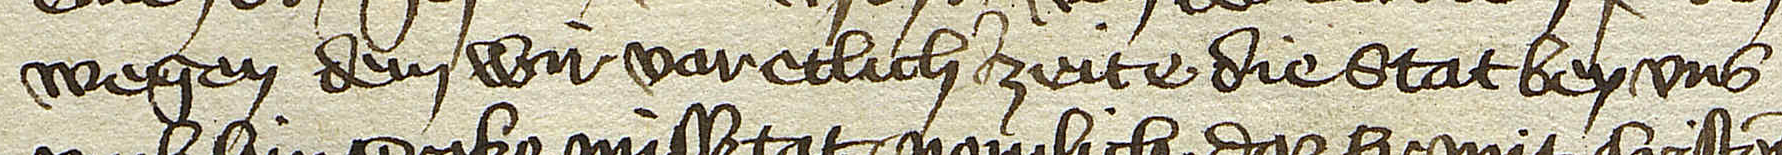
wegen dem wir vor etlich* cʒeite die Stat bey vns
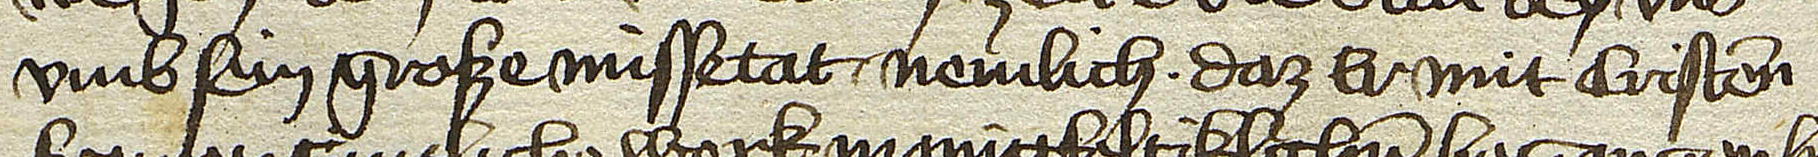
vmb ſein groſʒe miſſetat* nemlich . daʒ Er mit Criſten*
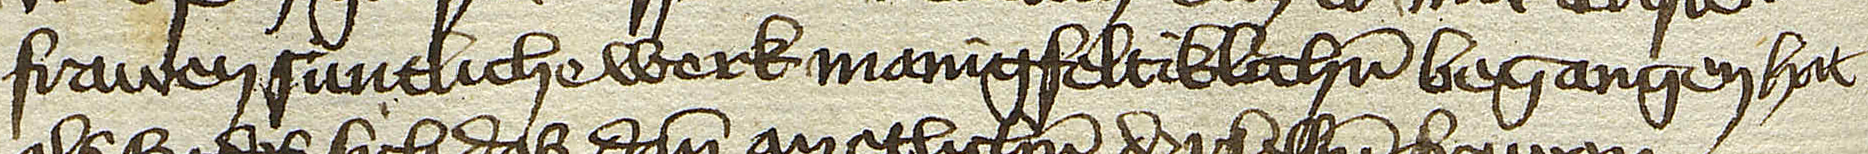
frawen ſüntliche werk manigfeltiklich*n begangen hat
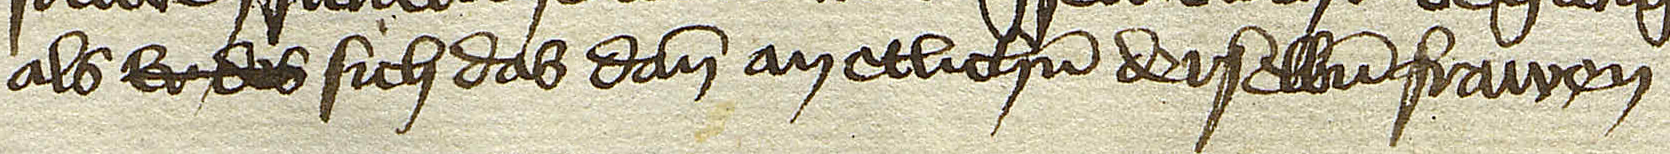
als Er des ſich das dan* an etlich*n derſelbn* frawen
